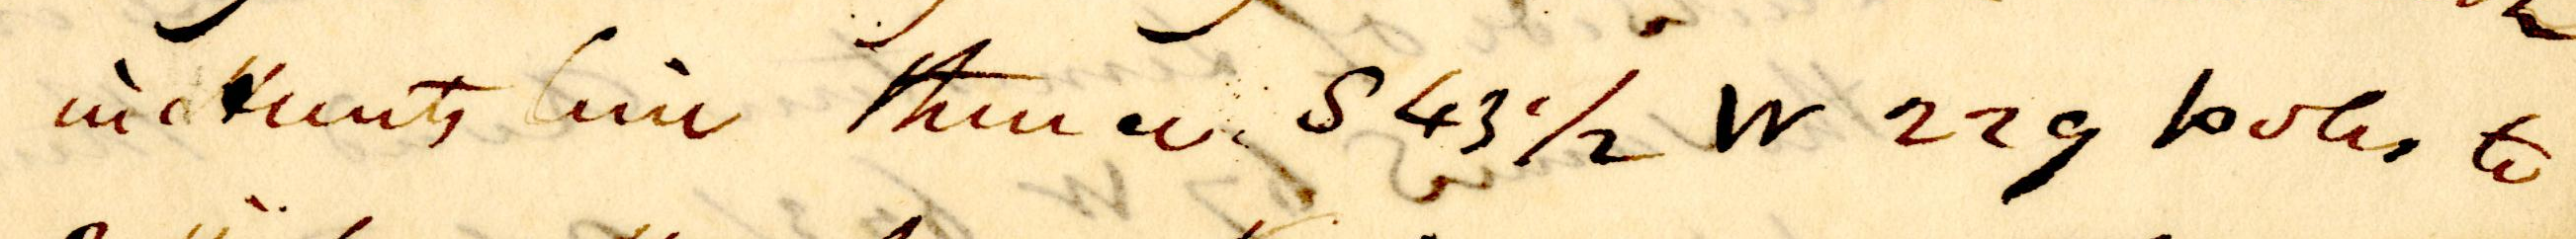in Hunts line thence S 43 1/2 W 229 poles to
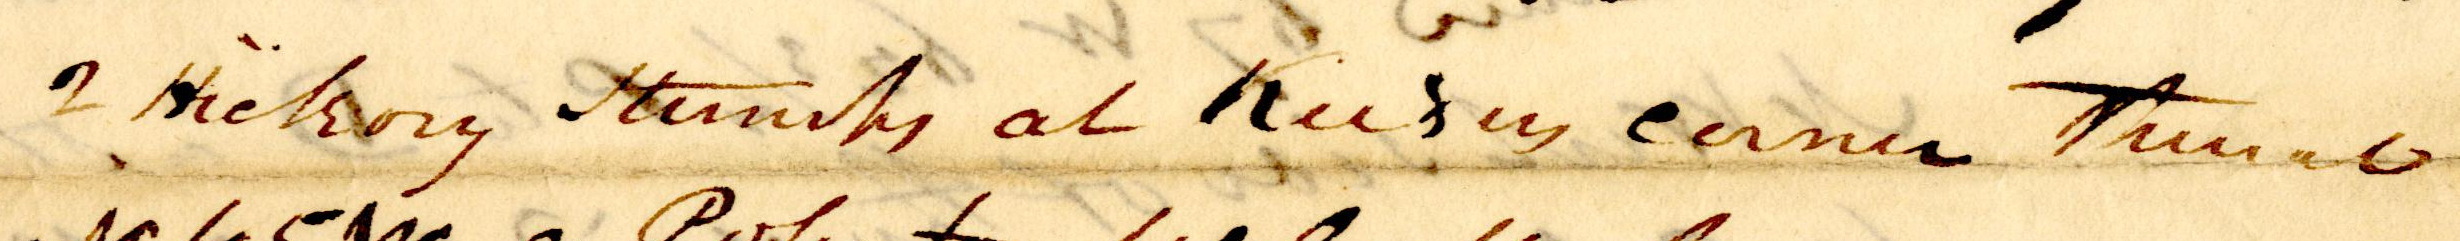2 Hickory stumps at Keley corner turned
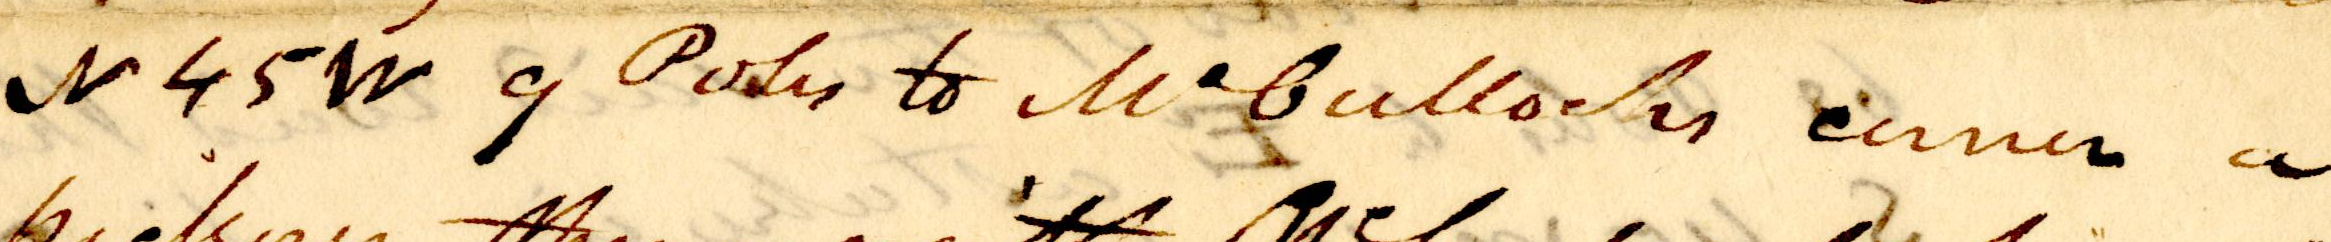N 45 W 9 poles to M^cCallows eance a
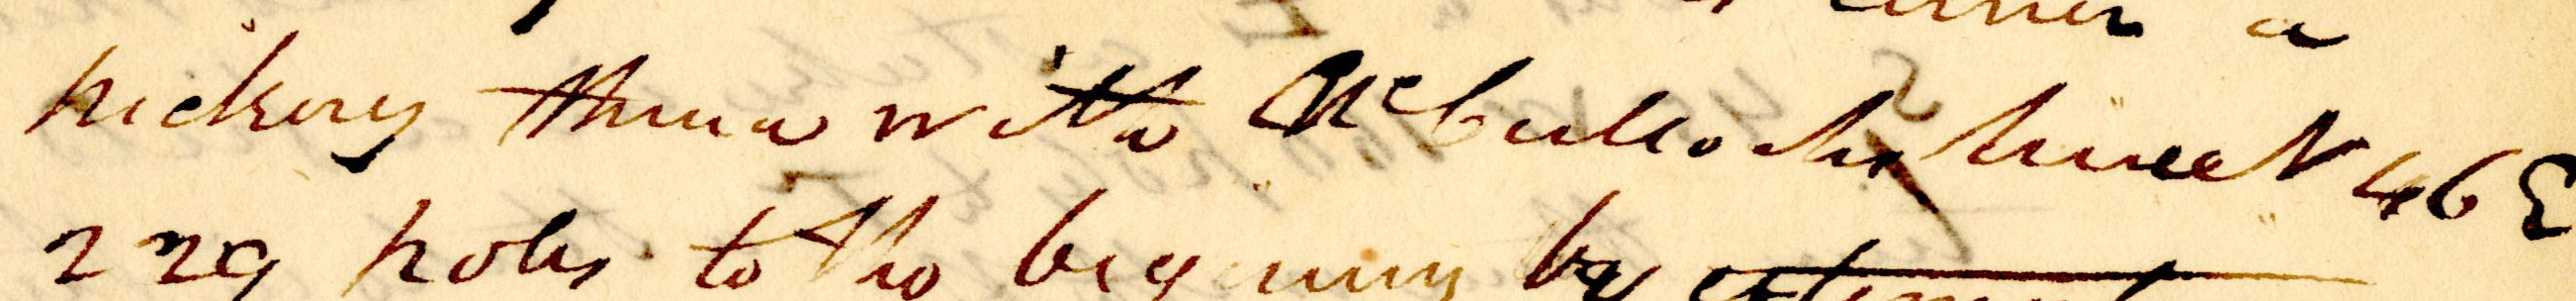Hickory thence with M^cCallow per hence N 46 E
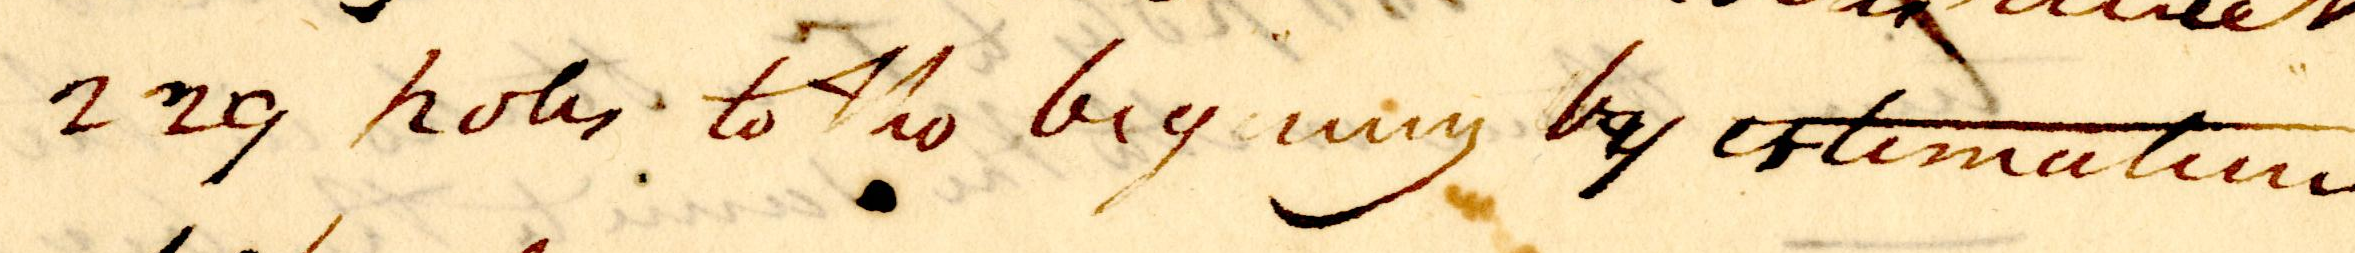229 Poles to the beginning by estimation
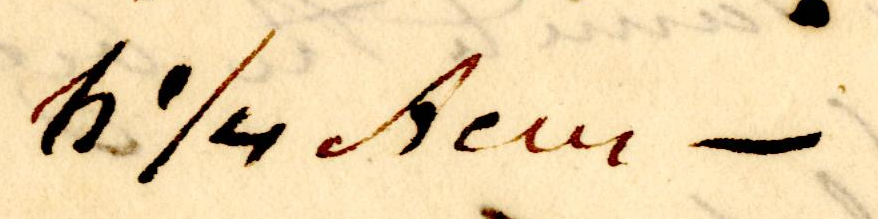h 1/4 sew.-
